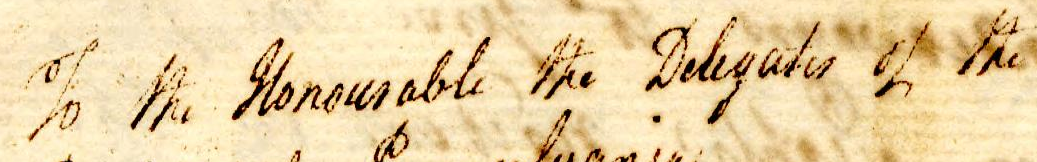To the Honourable the Delegates of the
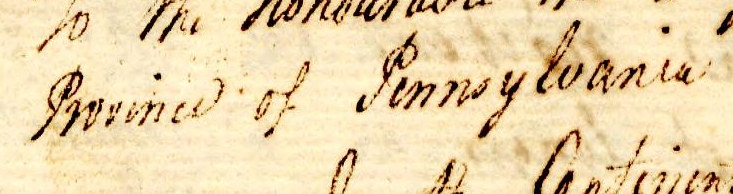Province of Pennsylvania,
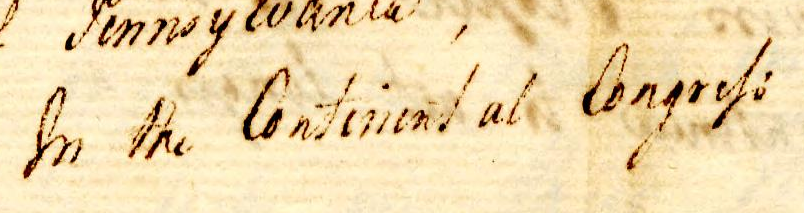In the Continental Congress.
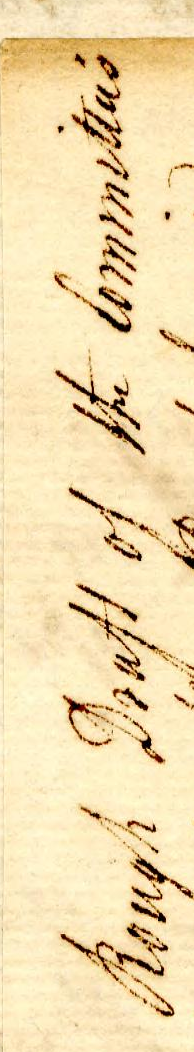Rough Draft of the Committee's
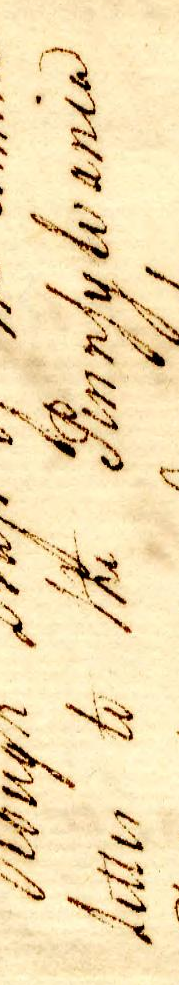Letter to the Pennsylvania
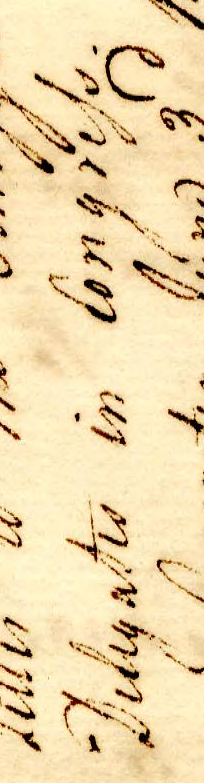Delegates in Congress.
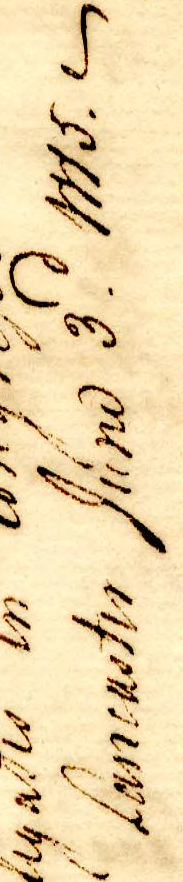Lancaster June 3^d. 1775.
